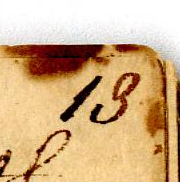13
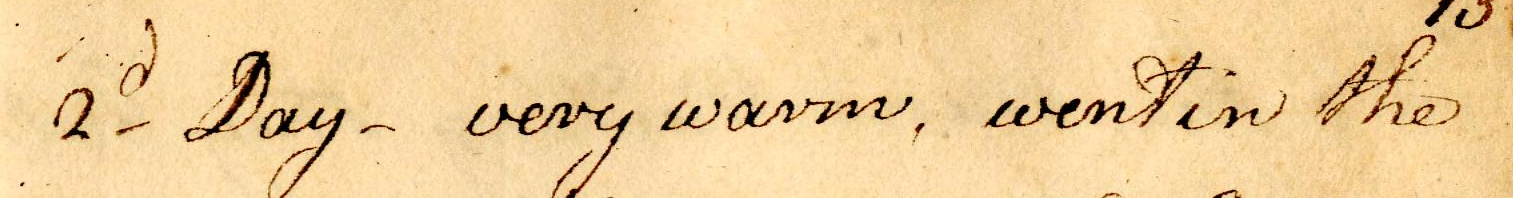2^d Day- very warm, went in the
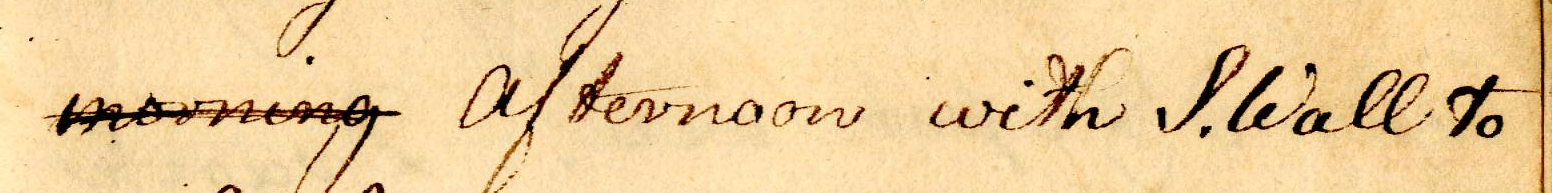[morning] Afternoon with S. Wall to
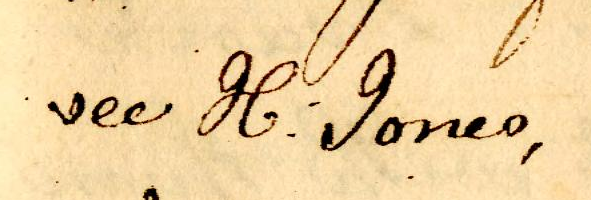see H: Jones,
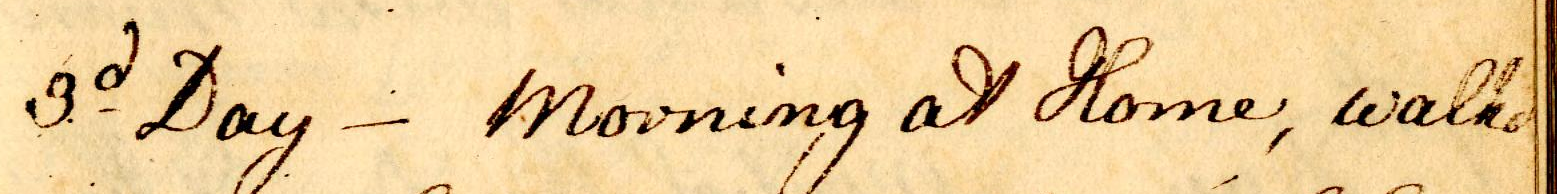3^d Day- Morning at Home, walkd
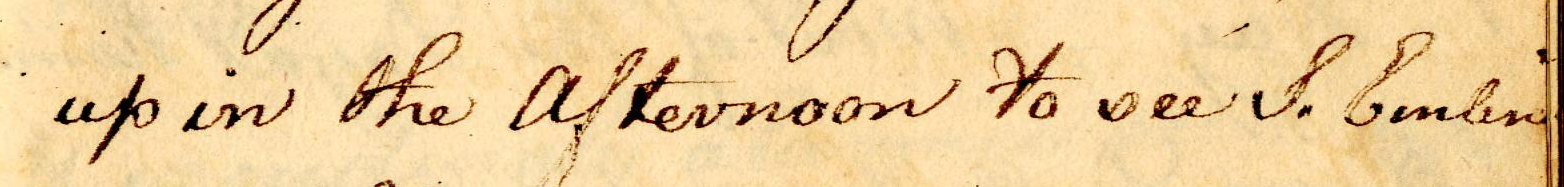up in the Afternoon to see S. Emlen
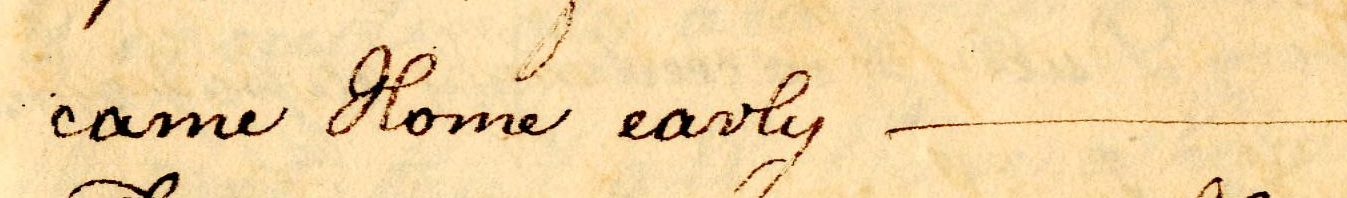came Home early-
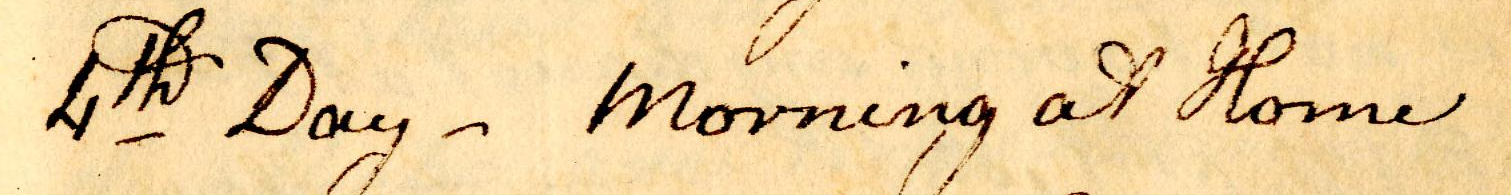4^th Day- Morning at Home
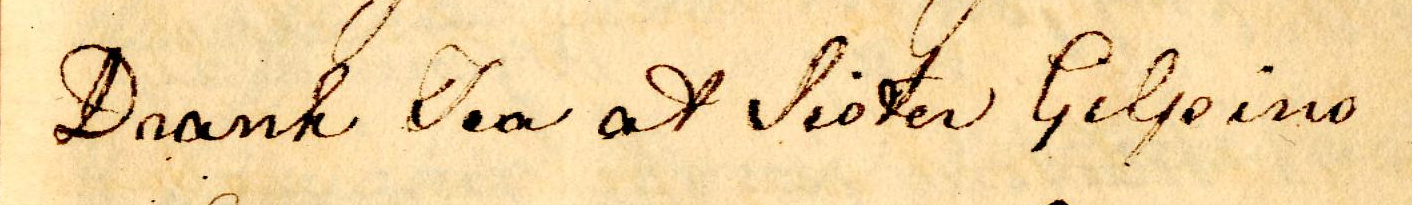Drank Tea at Sister Gilpins
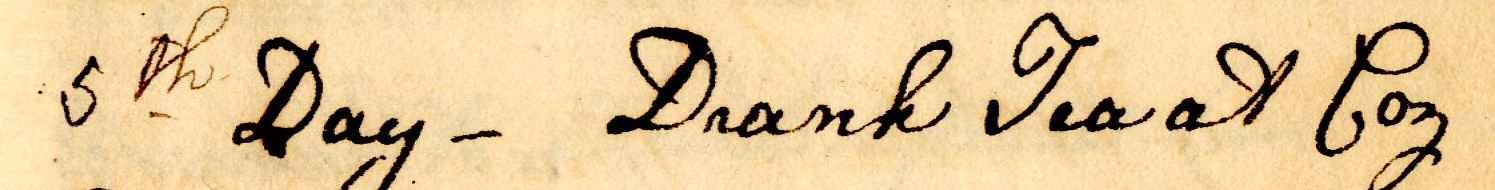5^th Day- Drank Tea at Coz
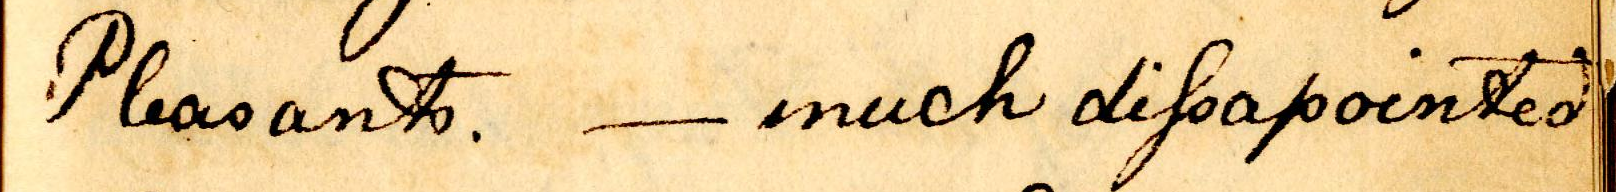Pleasants.- much dissapointed
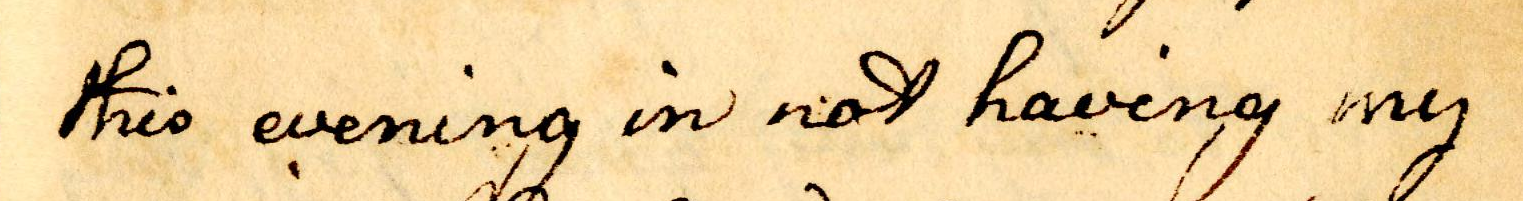this evening in not having my
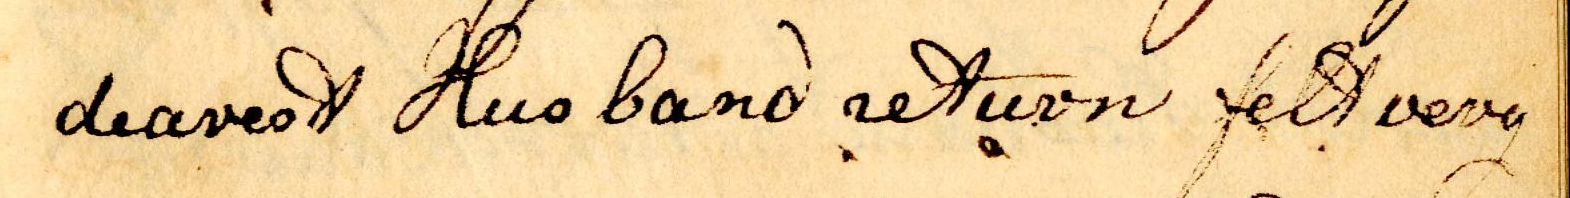dearest Husband return felt very
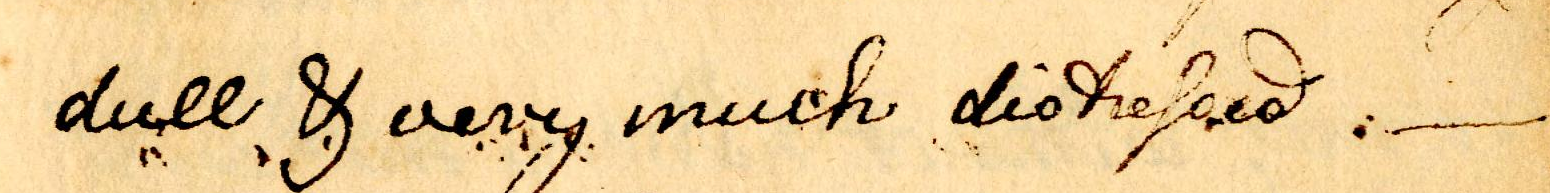dull & very much distressed.-
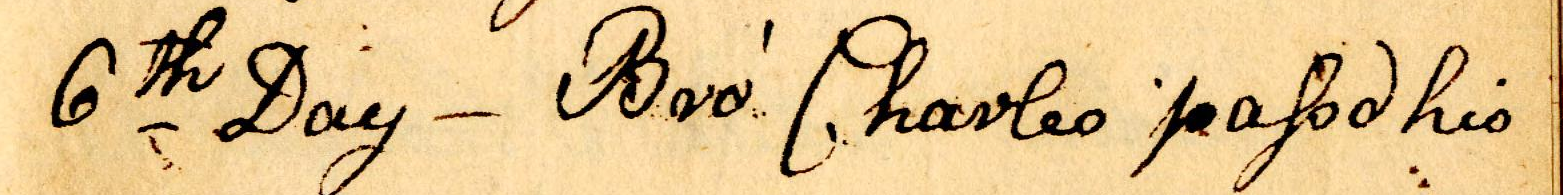6^th Day- Bro' Charles passd his
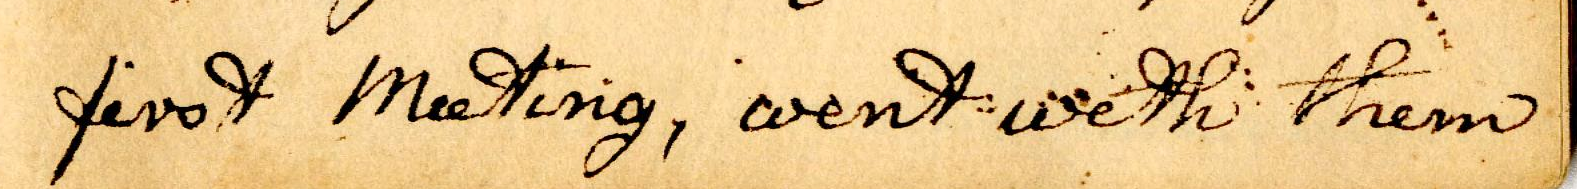first Meeting, went with them
